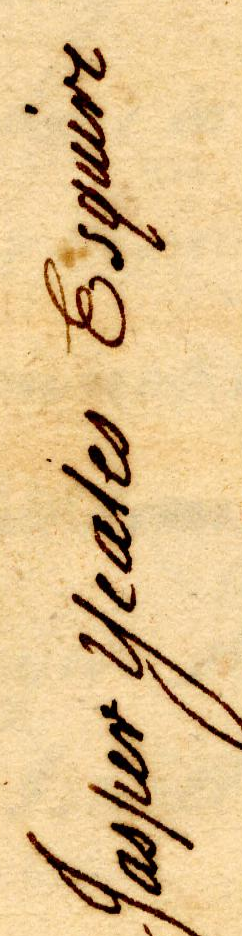Jasper Yeates Esquire
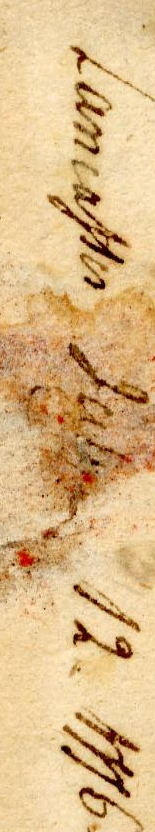Lancaster July 12. 1776.
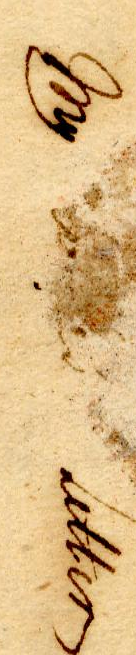My [Wife's] Letter
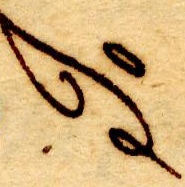To
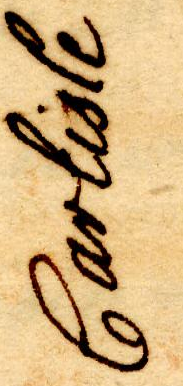Carlisle
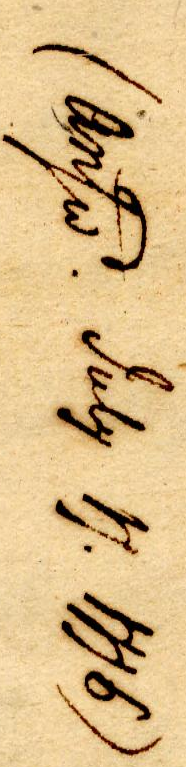(Answ^d. July 17. 1776)
